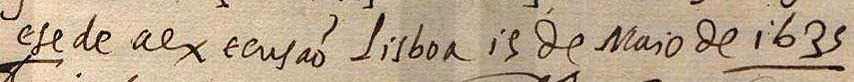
e se de a execusaõ Lisboa 15 de Maio de 1635
